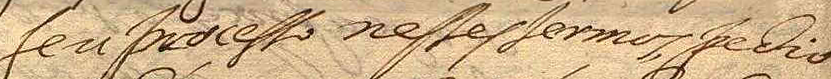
seu processo nestes termos, pedio
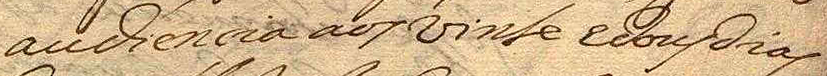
audiençia aos vinte e dous dias
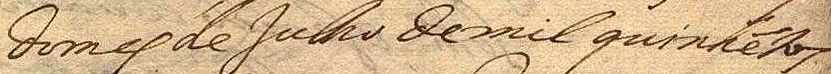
do mes de Julho de mil quinhētos
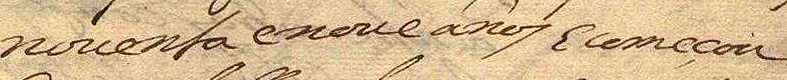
nouenta e noue an̄os E começou
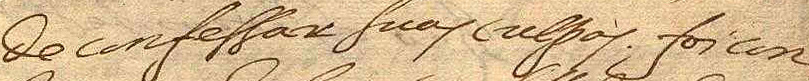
de confessar suas culpas. foi con
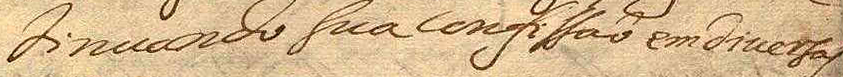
tinuando sua confissaõ em diuersas
